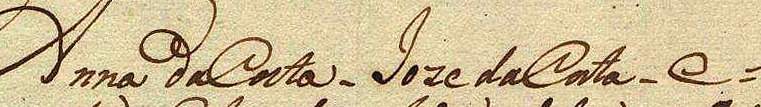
Anna da Costa - Ioze da Costa - e
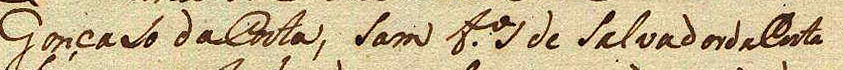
Gonçalo da Costa, sam f.os de Salvador da Costa
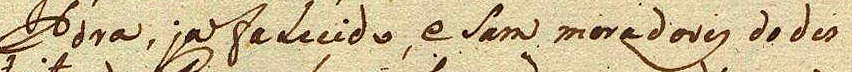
Edra, ja falecido, e sam moradores do des
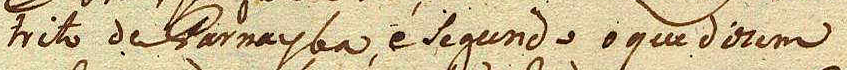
trito de Parnayba, e segundo o que dizem
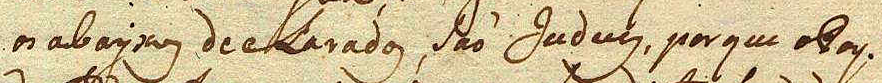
os abayxos declarados, são Judeus, porque o Pay.
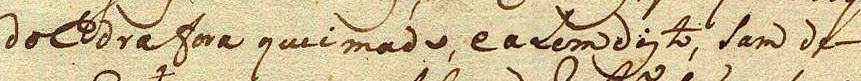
do Edra fora queimado, e alem disto, sam de
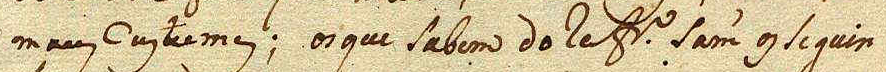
maus Custumes; os que sabem do Refr.o sam os seguin
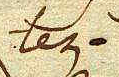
tez.
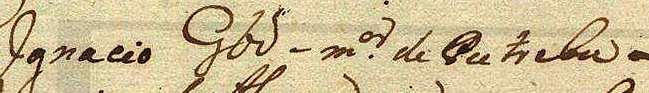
Ignacio Glz -m.or de Putrebu
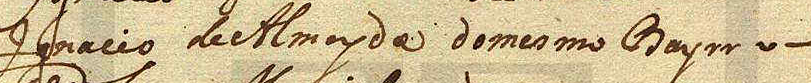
Jgnacio de Almeyda do mesmo Bayrro
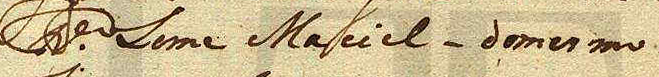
V.o Leme Masciel do mesmo
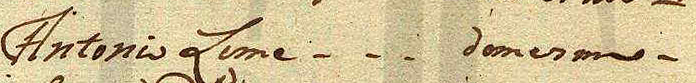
Antonio Leme - - - do mesmo
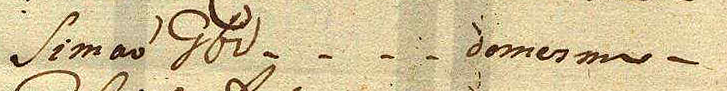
Simaõ Glz. - - - - do mesmo
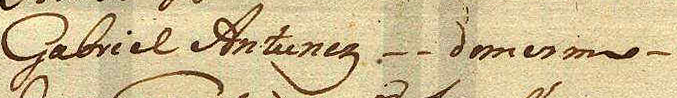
Gabriel Antunez - - do mesmo
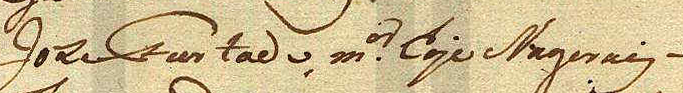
Joze Furtado, m.or hoje Na gerais
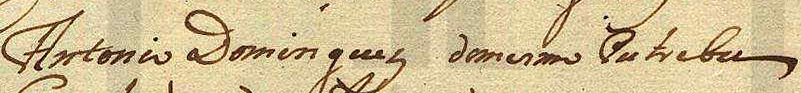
Antonio Dominguez do mesmo Putrebu
